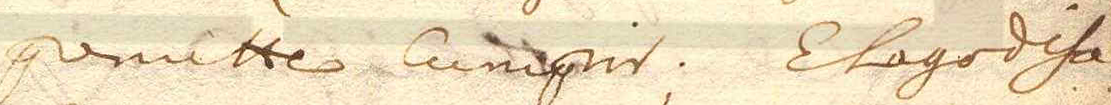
prometteo Cumprir; E logo disse
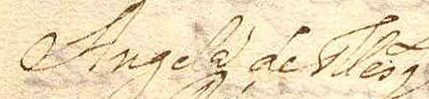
Angela de Mesq.ta
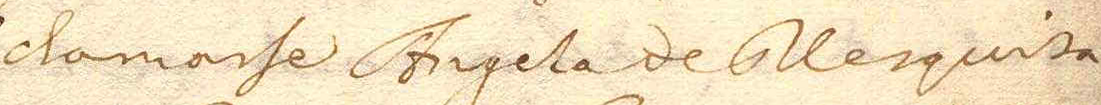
chamarse Angela de Mesquita
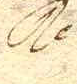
Ré
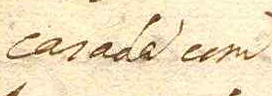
casada com
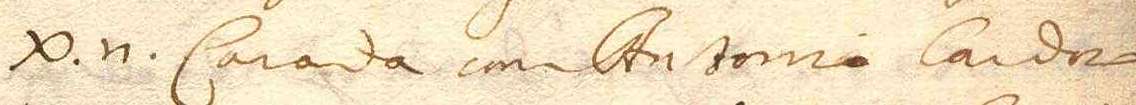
x.n. Casada com Antonio Cardozo
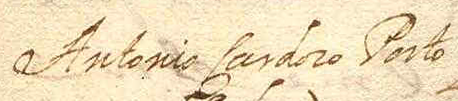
Antonio Cardozo Porto
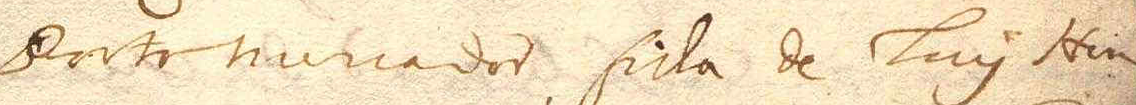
Porto mercador, filha de Luis Hen
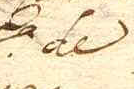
f.a de
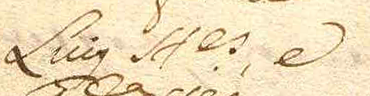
Luis H.es, e
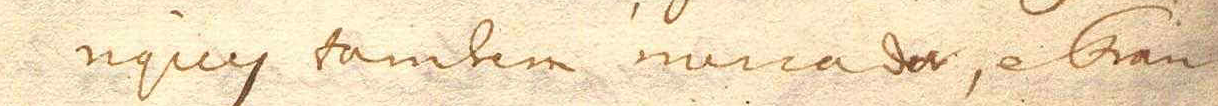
riques tambem mercador, e Fran
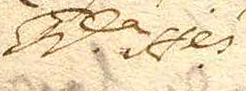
Fr.ca H.es
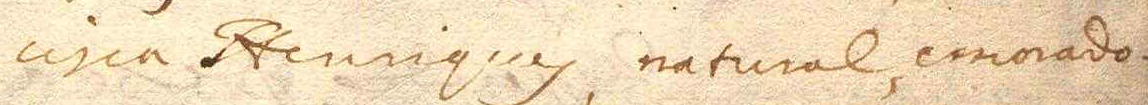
cisca Henriques, natural, e morado
